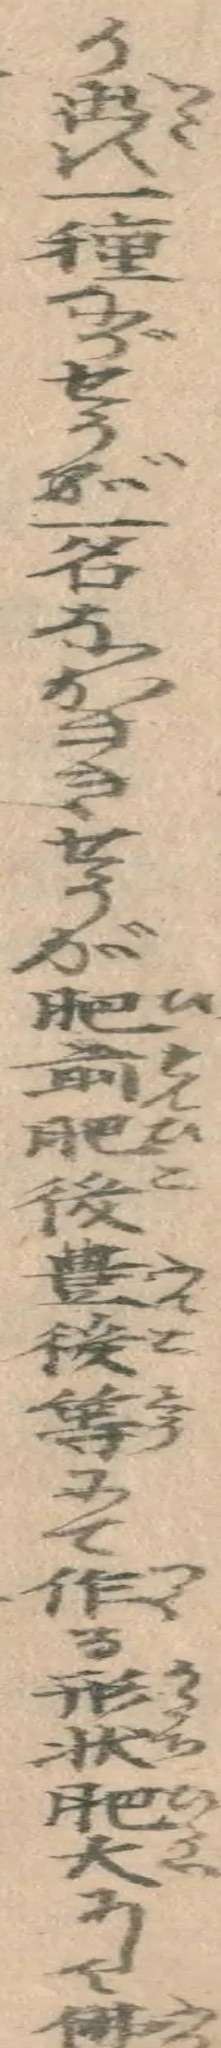り出す一種ながせうが一名なかさきせうが肥前肥後豊後等にて作る形状肥大にして仏
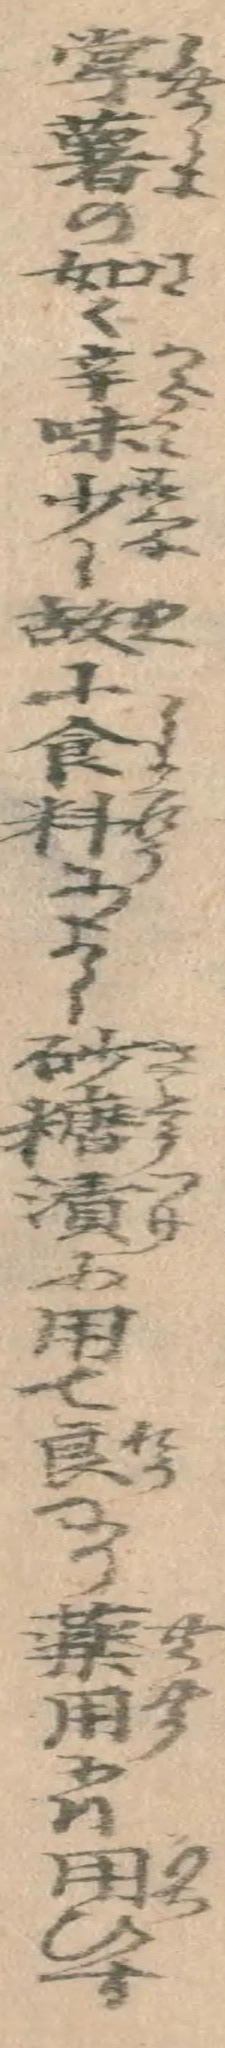掌薯の如く辛味少し故に食料によし砂糖漬に用て良なり薬用には用ひす
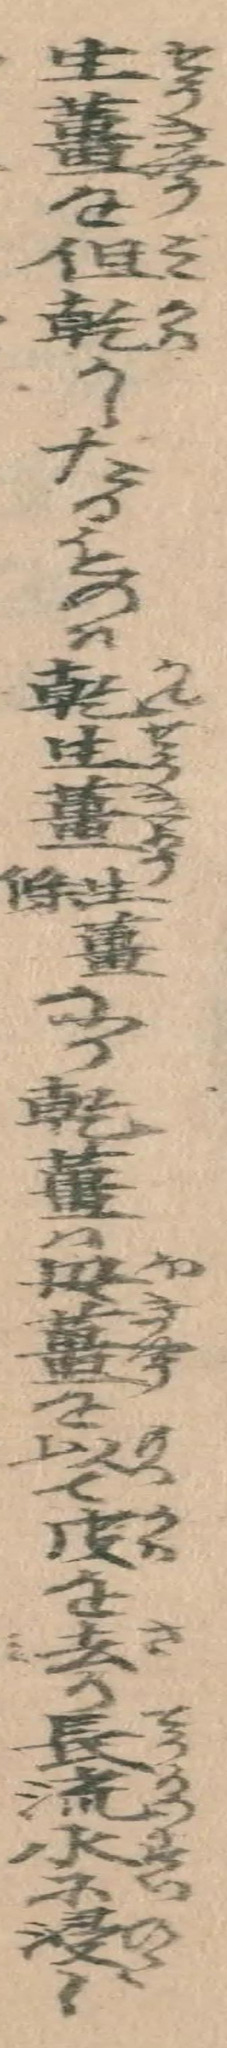生薑を但乾かしたるものは乾生薑生薑条なり乾薑は母薑を以て皮を去り長流水に浸し
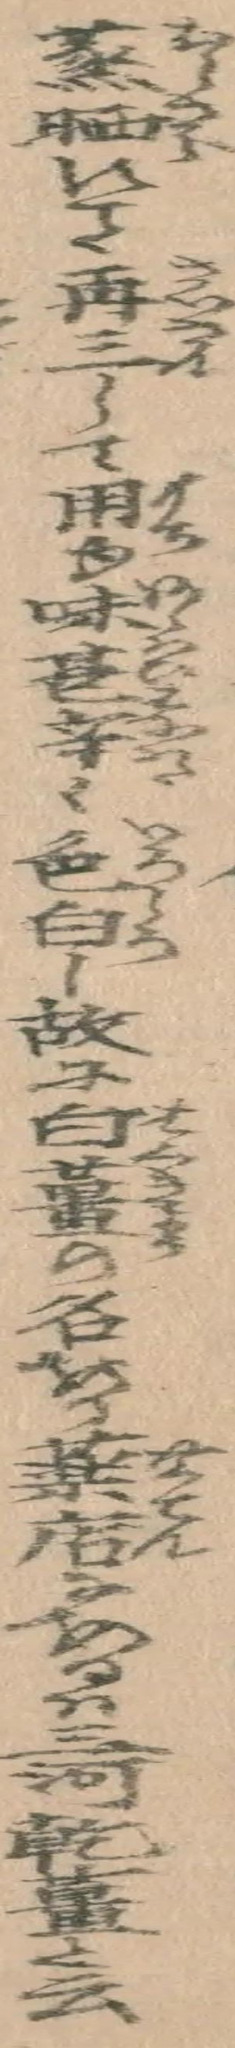蒸晒すこと再三して用ゆ味甚辛く色白し故に白薑の名あり薬店にあるは三河乾薑と云
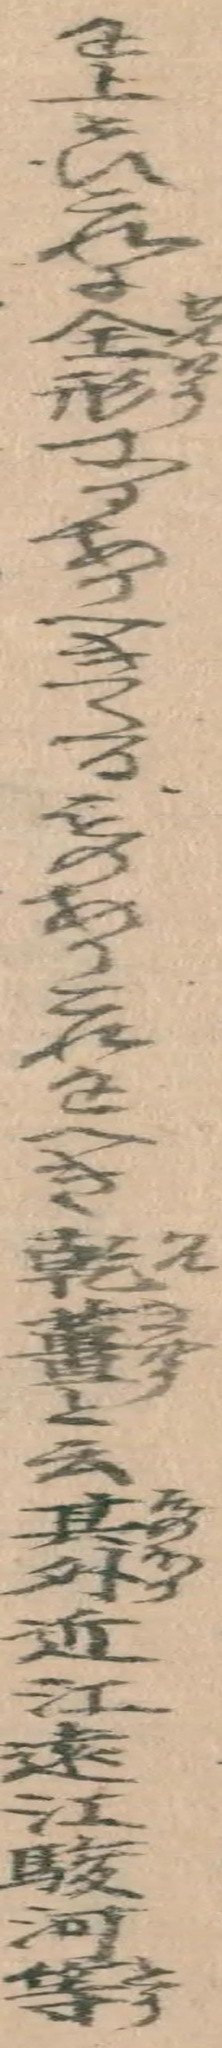を上とすこれに全形なるありへきたるものありこれをへき乾薑と云其外近江遠江駿河等
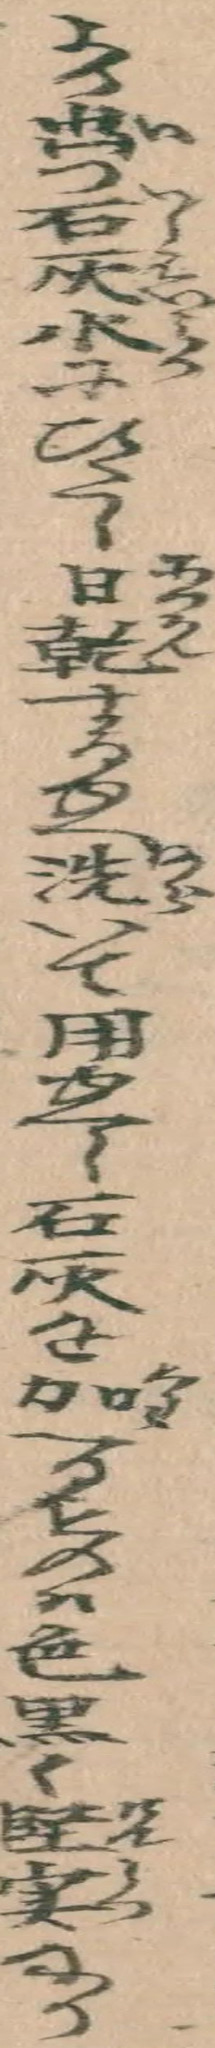より出つ石灰水にひたし日乾するゆへ洗いて用ゆへし石灰を加へるものは色黒く堅実なり
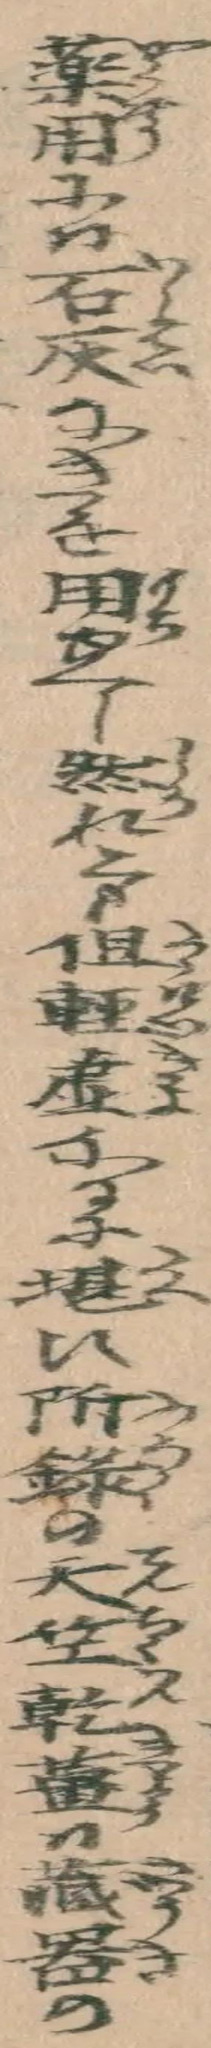薬用には石灰なきを用ゆへし然れとも但軽虚なるに堪す附録の天竺乾薑は蔵器の

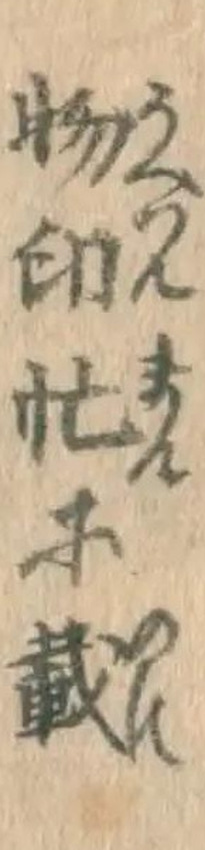物印忙に載
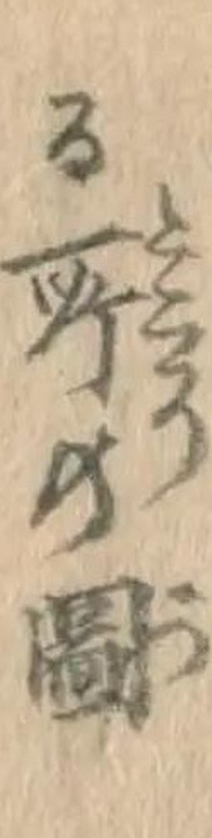る所の図

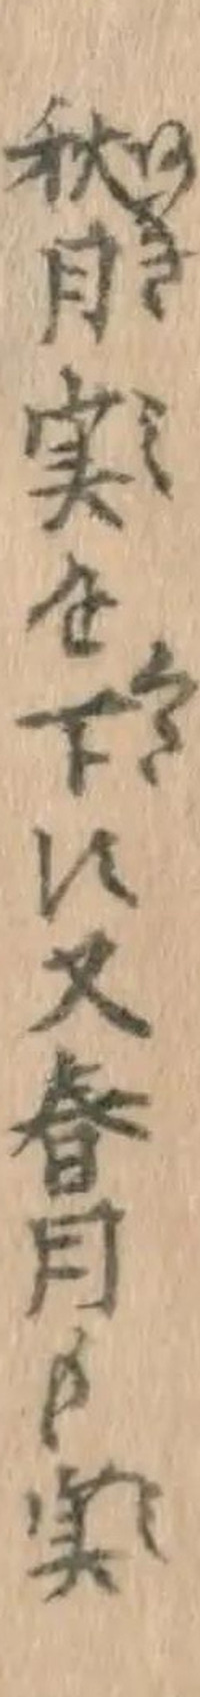秋月実を下す又春月も実
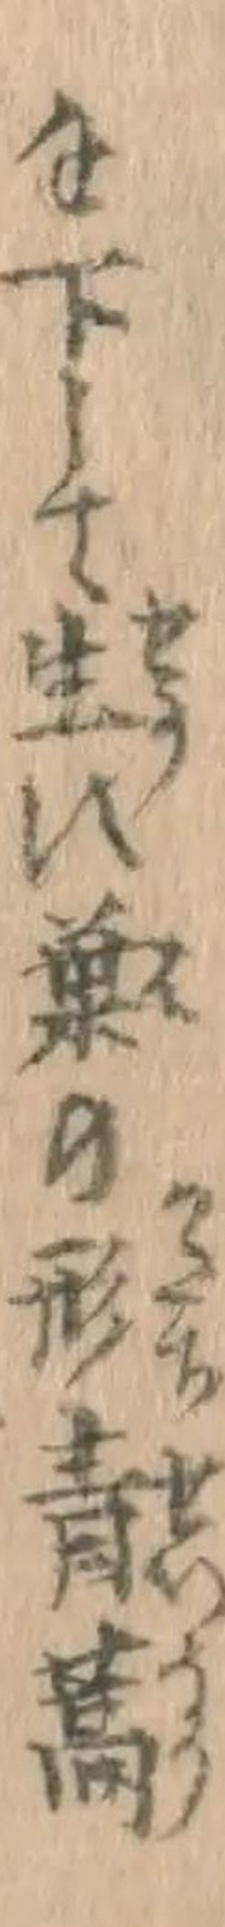を下して生す葉の形青蒿
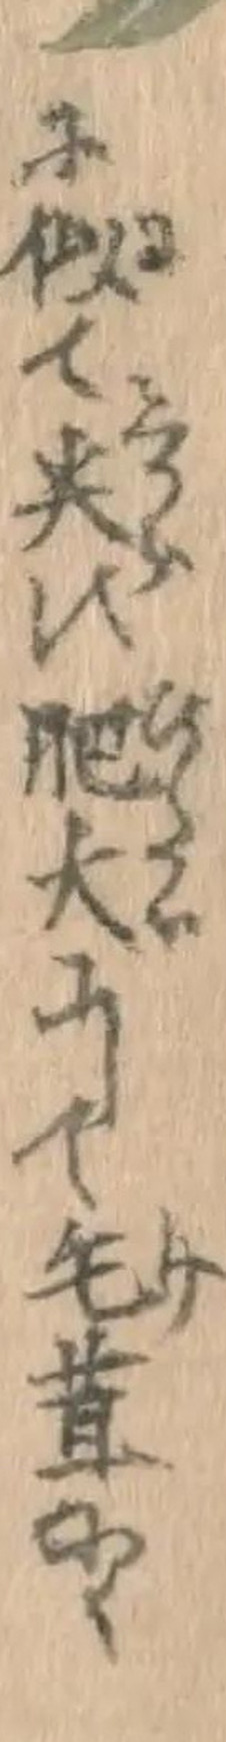に似て尖す肥大にして毛茸なく
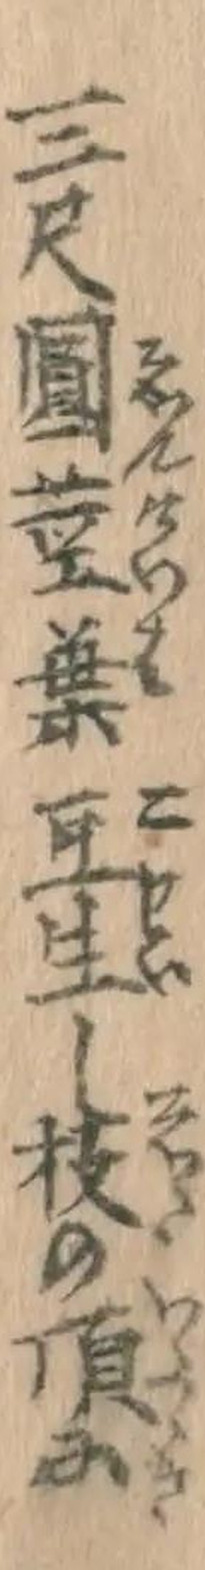三尺円茎葉互生し枝の頂に
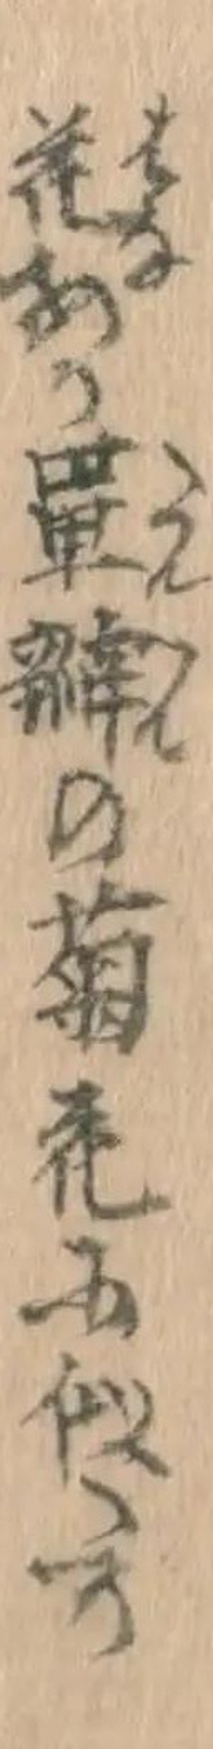花あり単弁の菊花に似たり
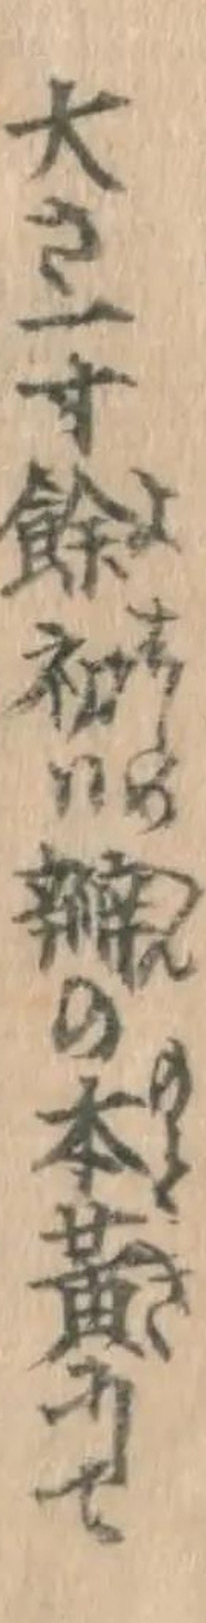大さ一寸余初は弁の本黄にして
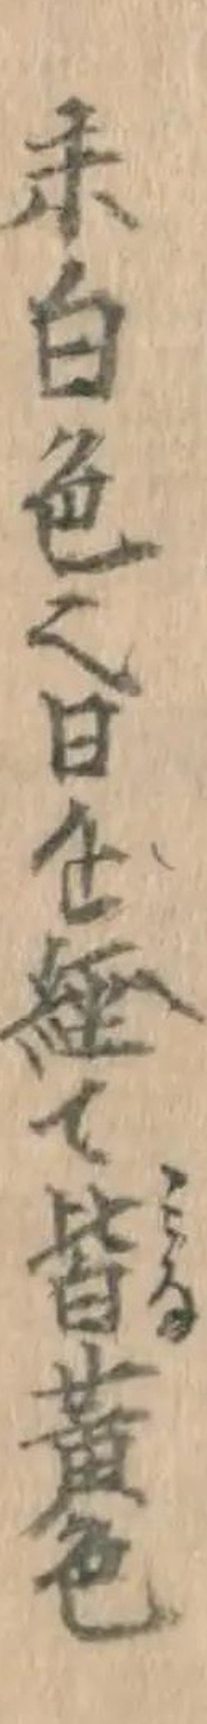末白色也日を経て皆黄色
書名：本草図譜. 巻46-48
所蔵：国立国会図書館 National Diet Library, JAPAN
